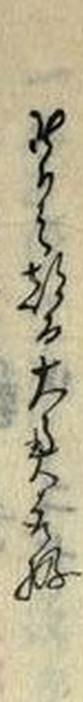被下之都而大奥取扱
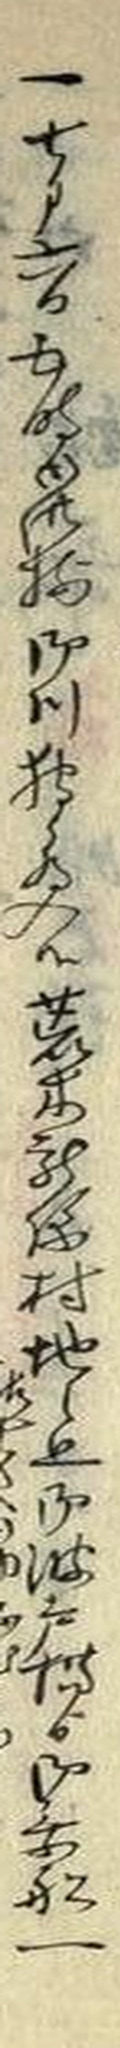一七月六日五時御供揃御川狩被為入候荒木新保村地之上御波戸場ゟ御乗船一
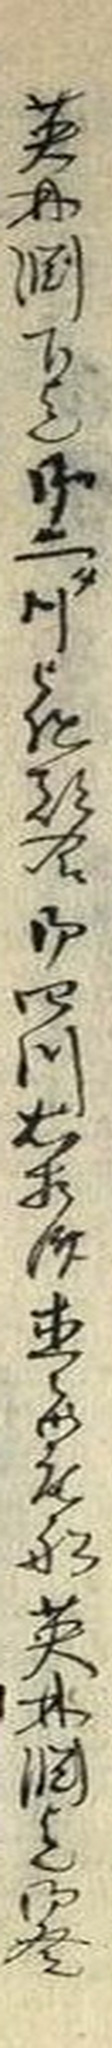英林淵下迄御二タ川被遊都合御四川右相済直ニ御座船英林淵迄御登
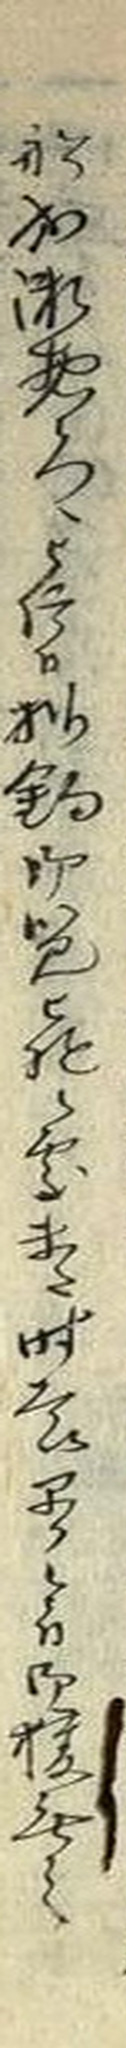船成瀬惣右衛門へ被仰付掛鉤御覧被遊候処未た時節早ク候ニ付御獲無之
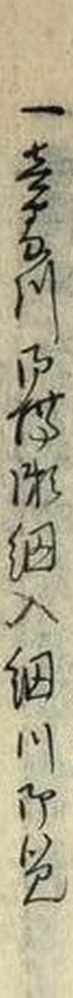一壱番川御場瀬網入網川御覧

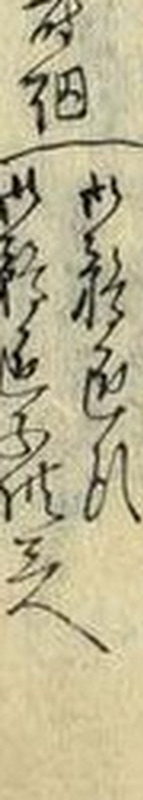御鵜匠子供三人
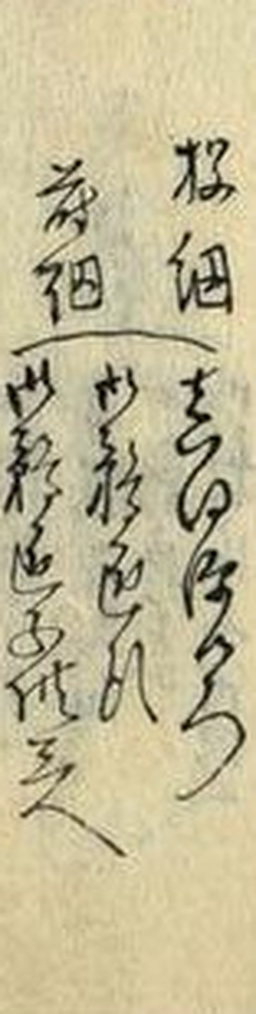御鵜匠子供三人
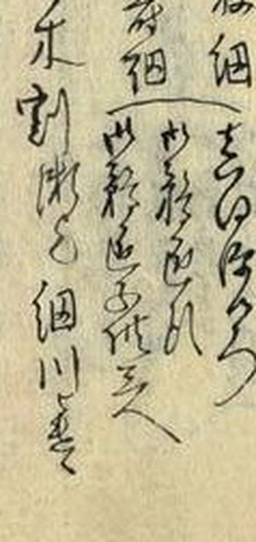御鵜匠子供三人
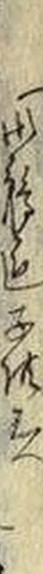御鵜匠子供三人
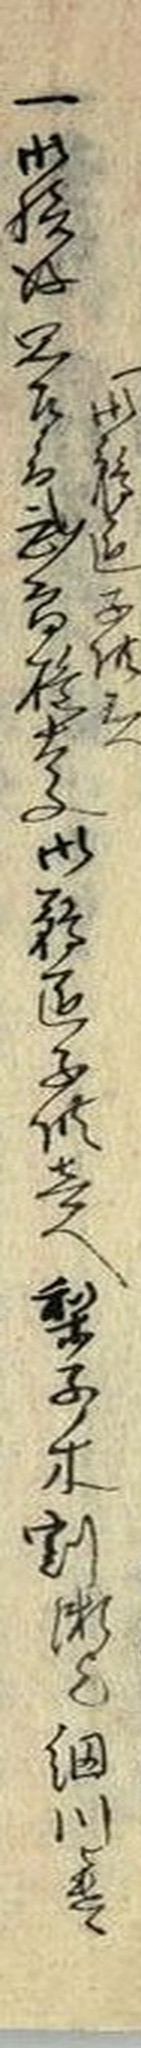一御膳後思召ニ而武曾権太夫御鵜匠子供壱人梨子ノ木割瀬迄網川被遣候
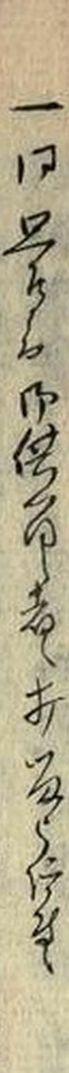一同思召ニ而御供筒之者へ打留被仰付候
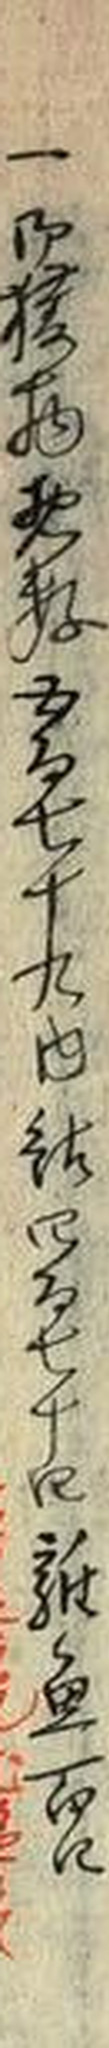一御獲物惣数五百七十九内鮎四百七十四雑魚百四
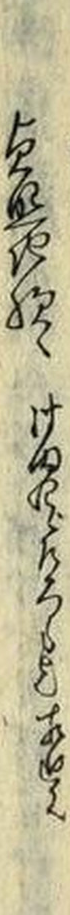同二十貞照院様へ津田四郎左衛門方迄相廻ス
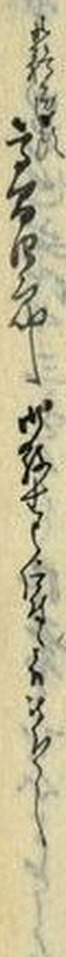高村荒次郎御殺生被仰付候ニ付被下之
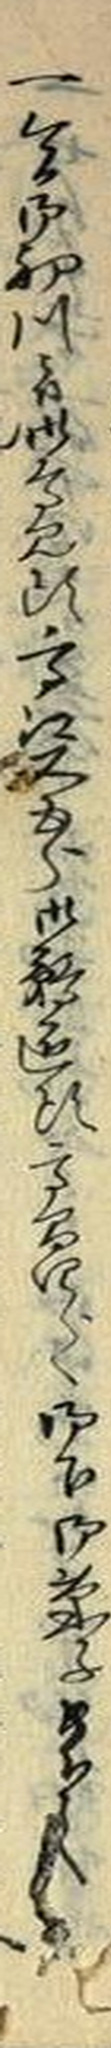一今日御初川ニ付御鳥見頭高江又五郎御鵜匠頭高間四郎へ御下御菓子被下之
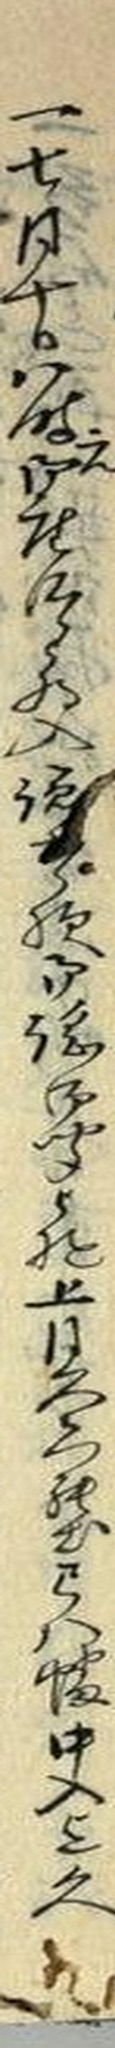一七月十日八時元御座所へ被為入謙五郎様御謡御聞被遊上月久右衛門罷出弓八幡中入迄久
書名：少傅日録抄（斉承付側向頭取日記、在国）
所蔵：福井県文書館 Fukui Prefectural Archives
